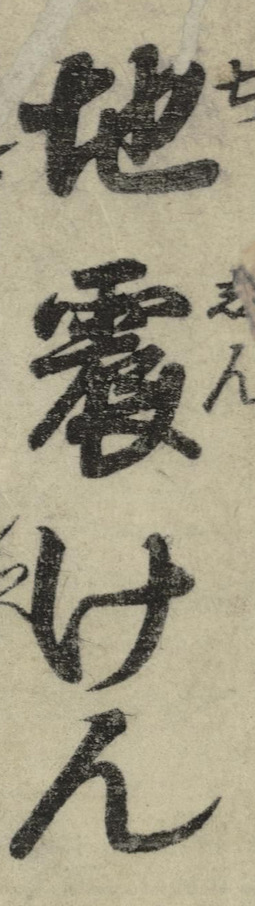地震けん
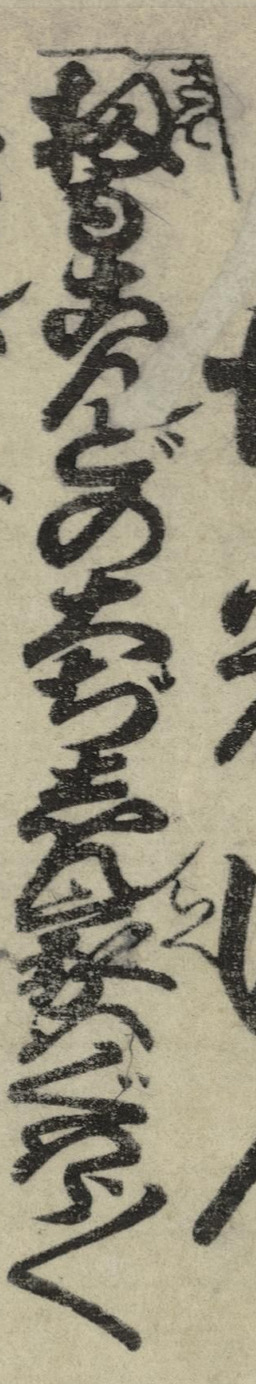〽扨もこんどの大ぢしん家はぐはら〳〵
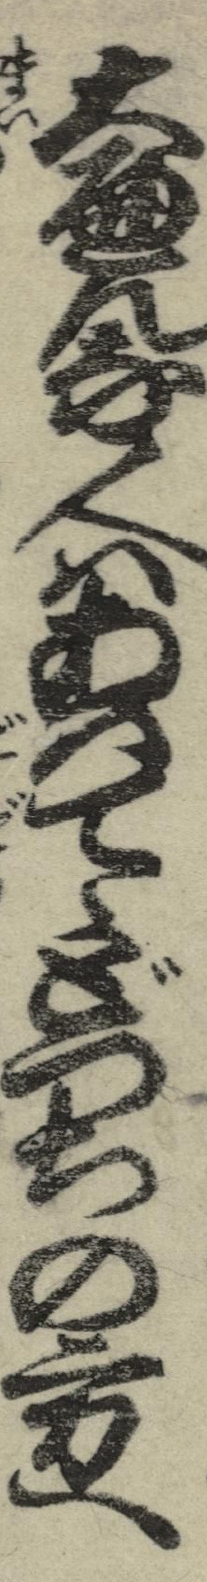大へんな人はあはてゝどつちの方へ
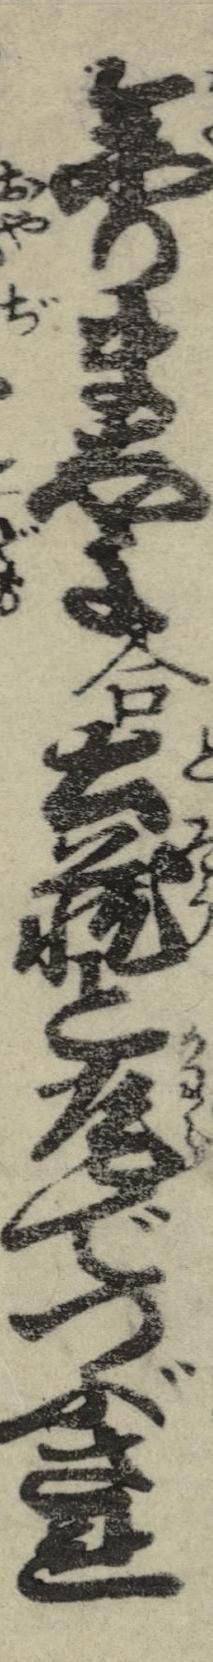参りましよ合土蔵と瓦でつぶされ
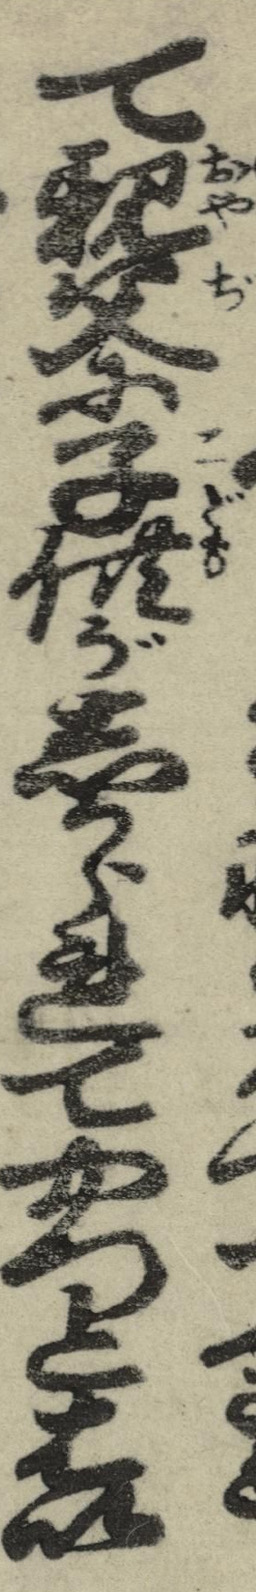て親父に子供がしかられてやつとはい
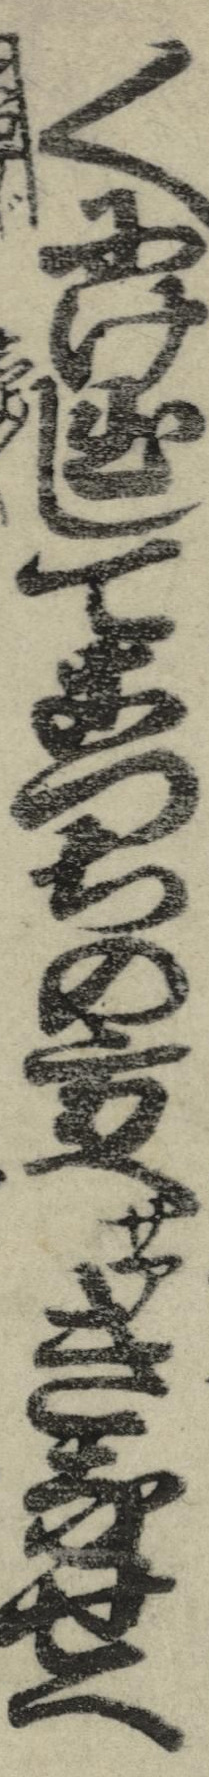〳〵にけ出してこつちの方へサアきなせへ
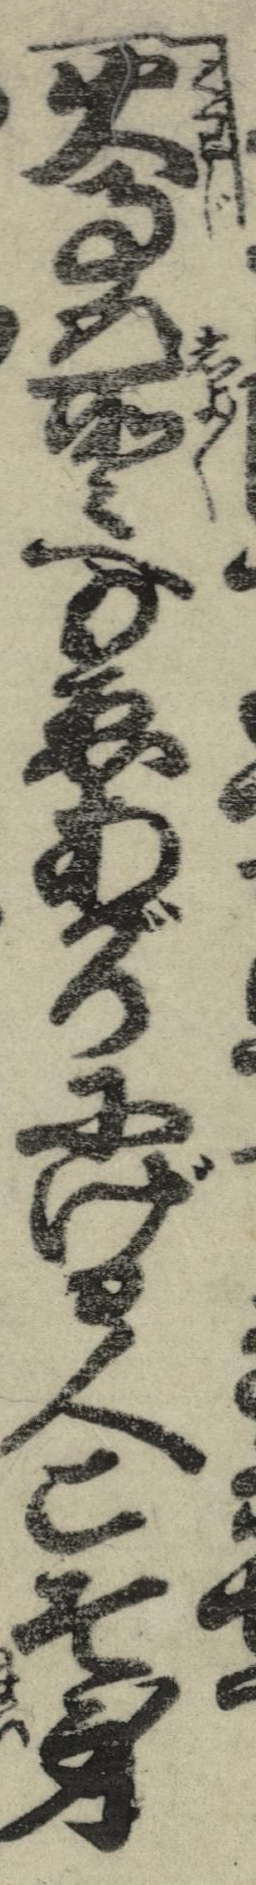〽火事は所々へもゑあがりにげる人こそ身
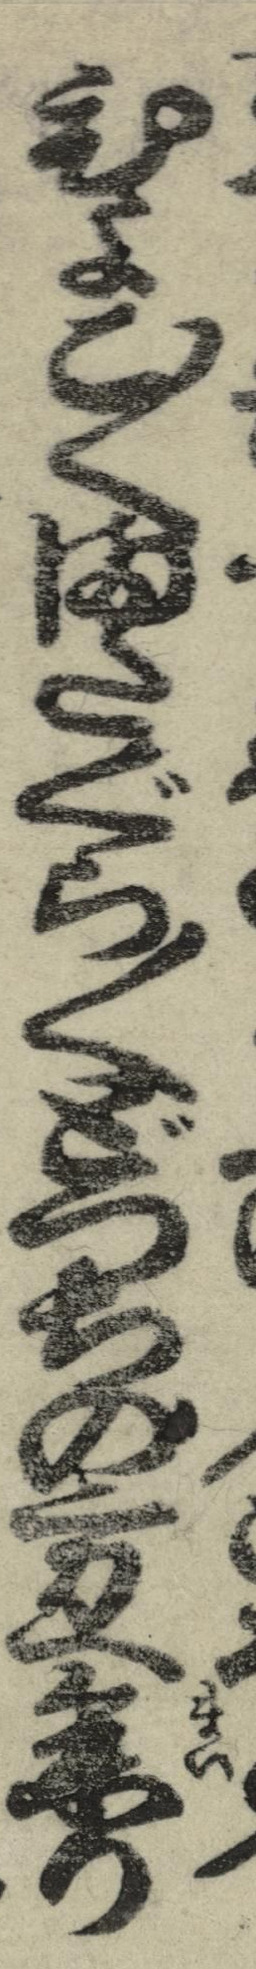ひよこ〳〵またぐら〳〵どつちの方へ参り
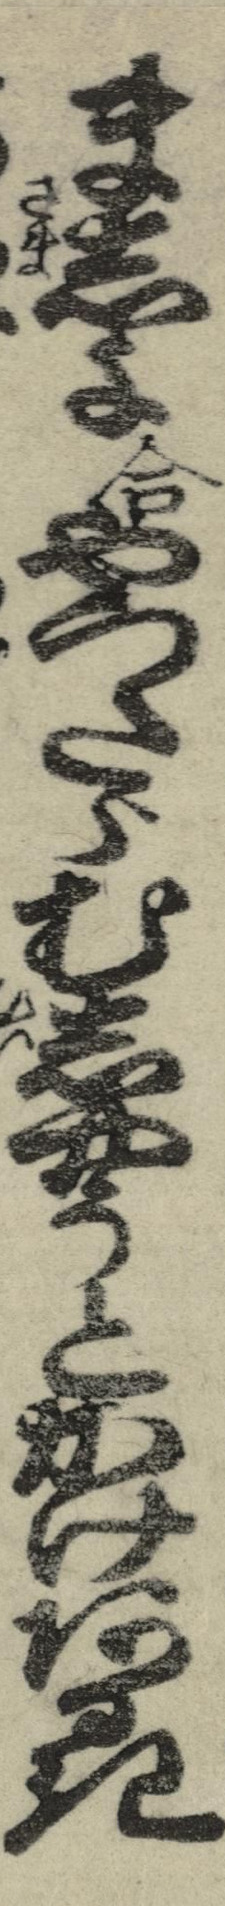ましよ合やつたらむしやうとかけあるき
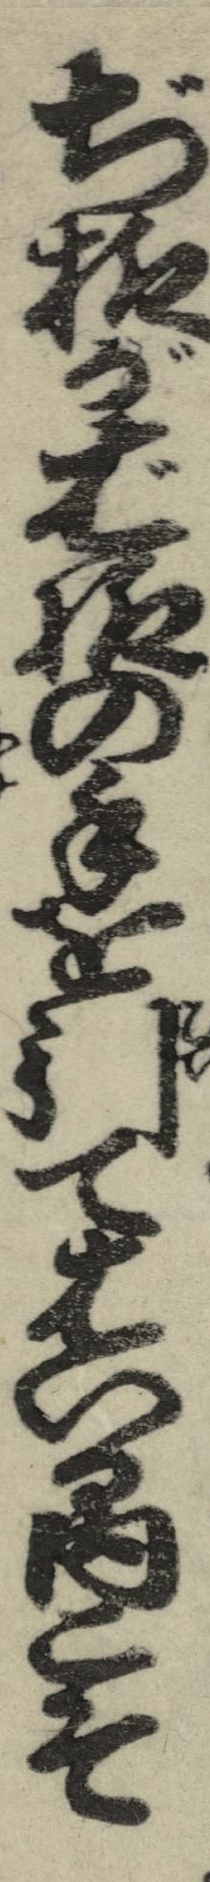ぢ様がば様の手を引てはいるうちこそ
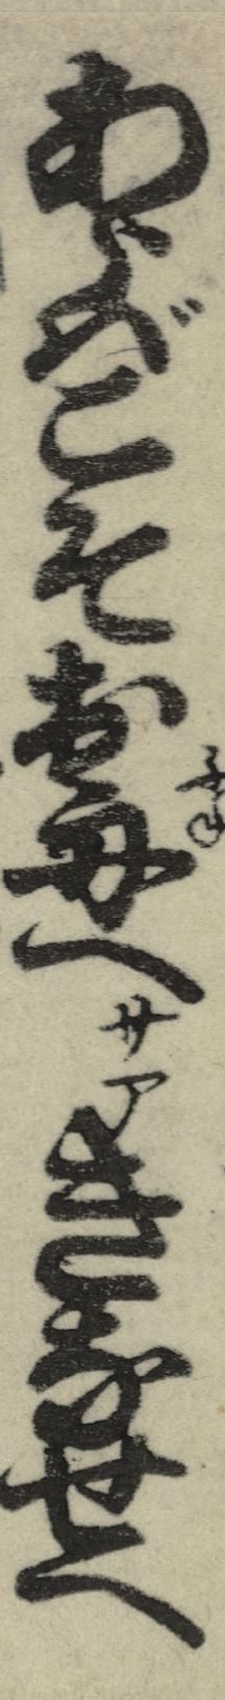あらばこそお舟へサアきなせへ
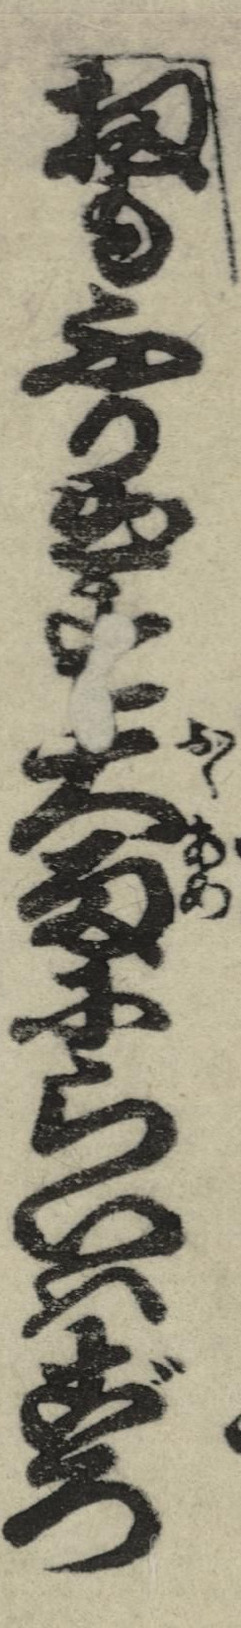〽扨もふり出す大雨にらいはごろ
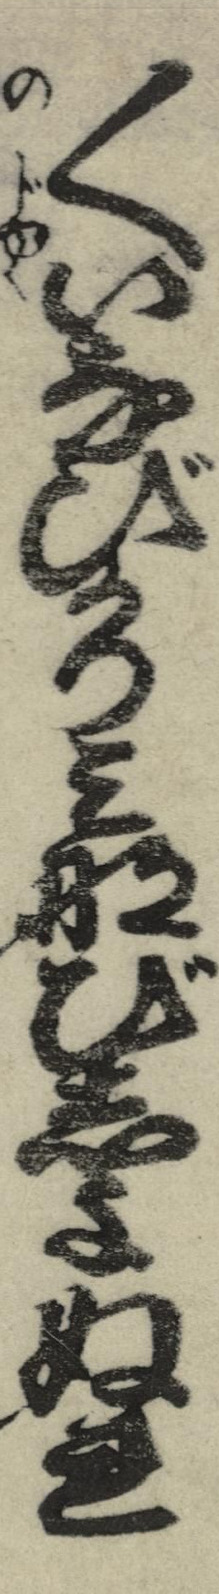〳〵いなびかりみなびしよぬれ
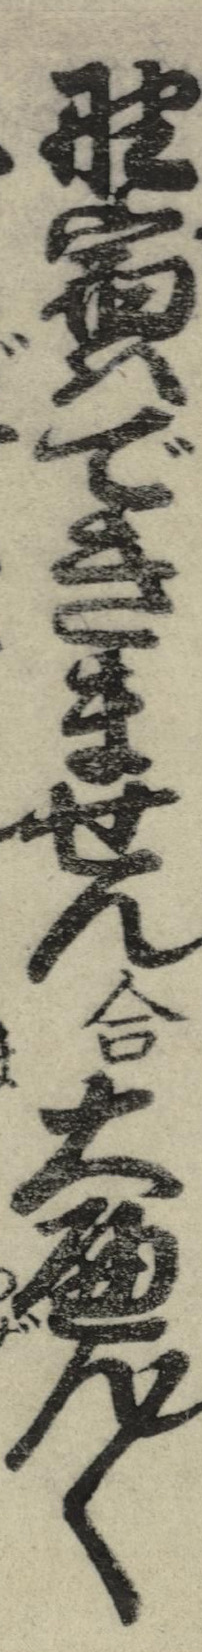野宿はできません合大へん〳〵
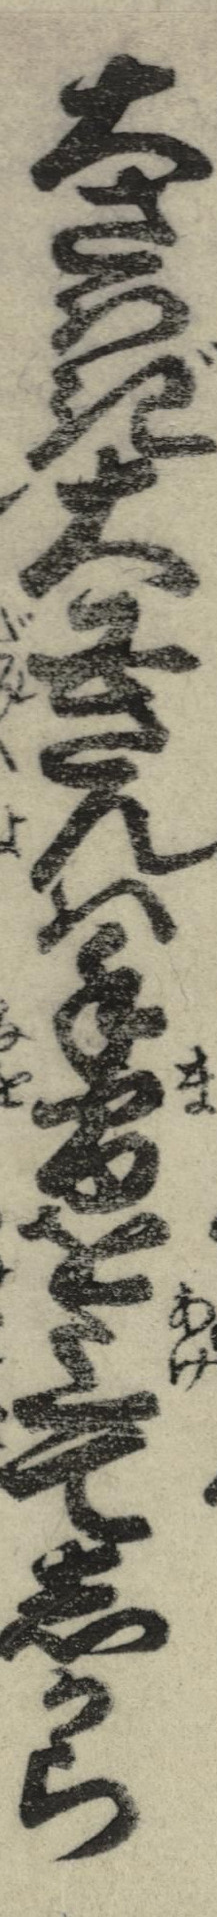大さはぎ大工さんは手間を上てしから
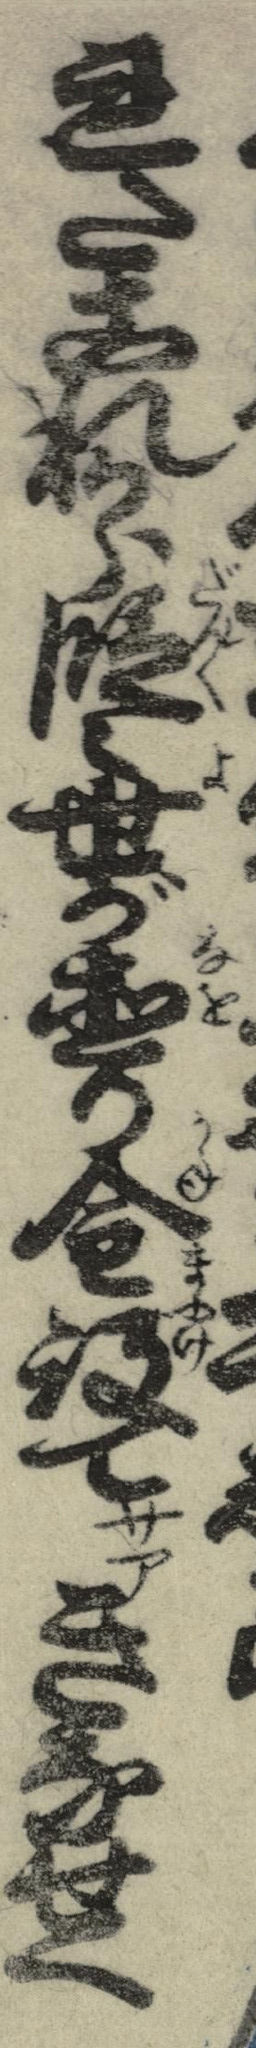れたこれから段〻世が直り金設てサアきなせへ
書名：地震けん
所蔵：東京大学地震研究所図書室 Earthquake Research Institute Library, The University of Tokyo, JAPAN
